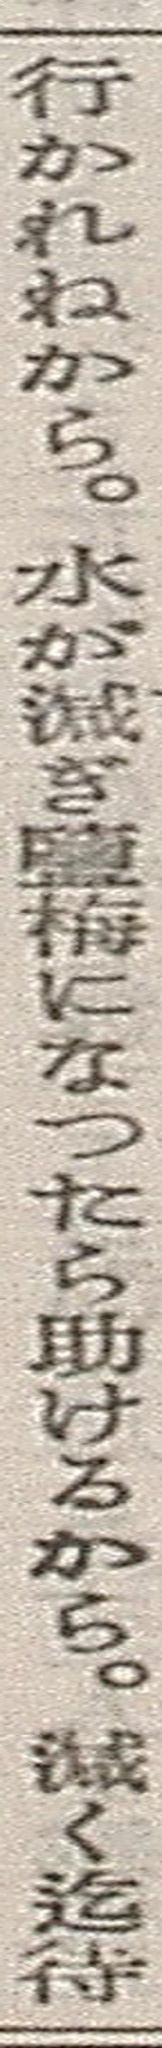行かれねから。水が減ぎ塩梅になつたら助けるから。減く迄待
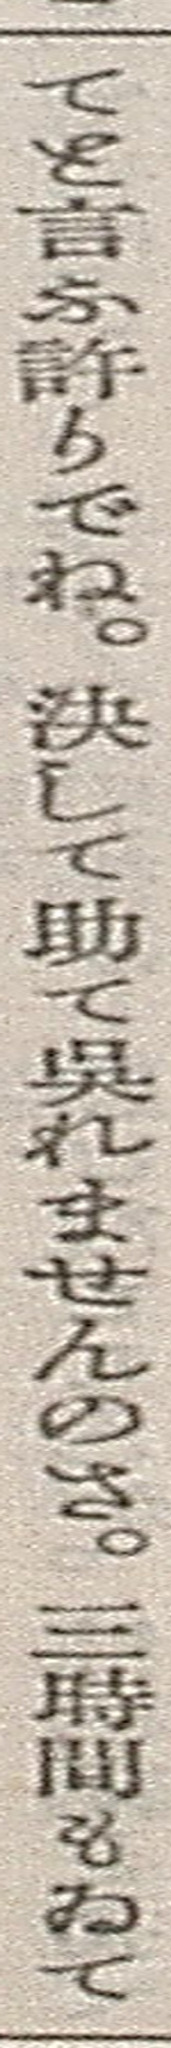てと言ふ許りでね。決して助て呉れませんのさ。三時間もゐて
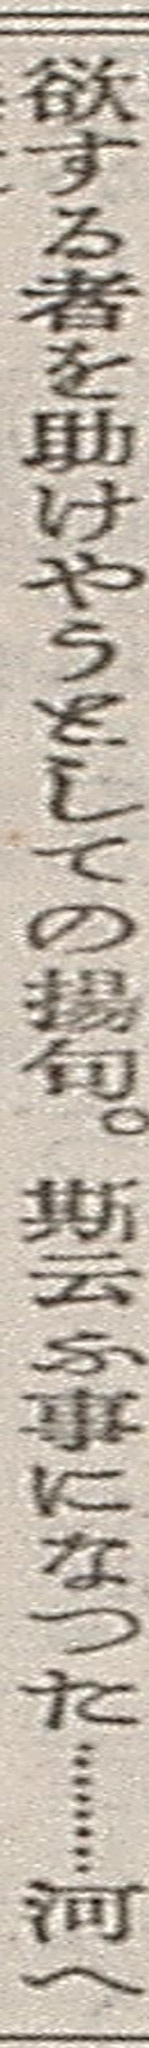欲する者を助けやうとしての揚句。斯云ふ事になつた………河へ
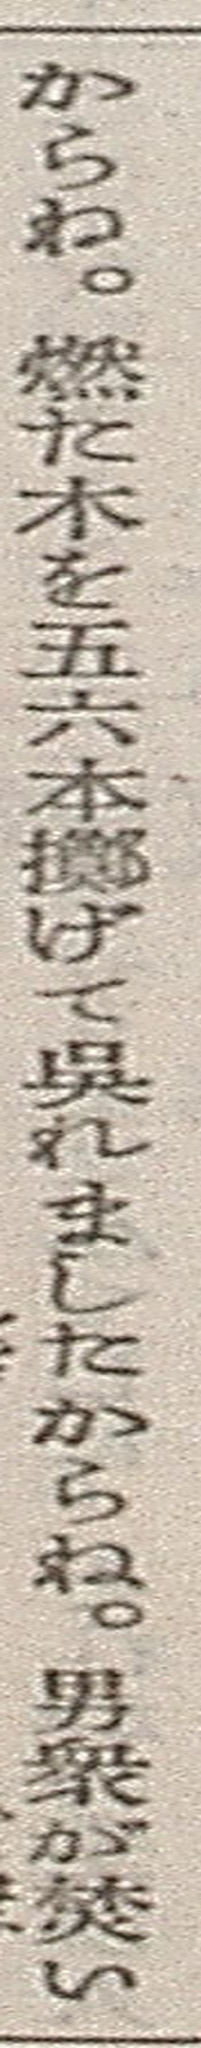からね。燃た木を五六本擲げて呉れましたからね。男衆が焚い
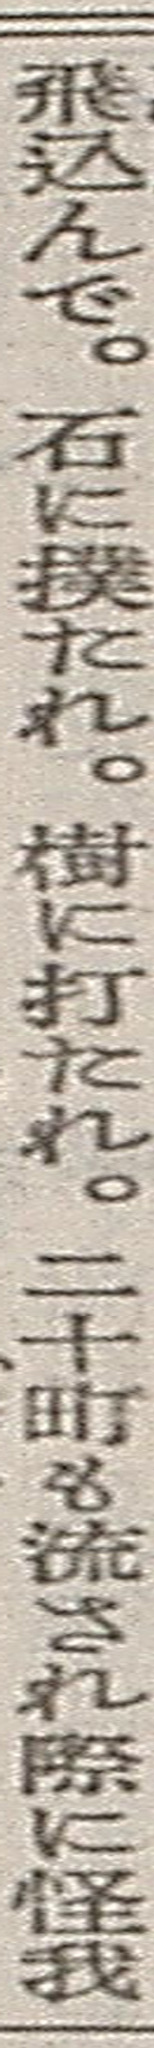飛込んで。石に撲たれ。樹に打たれ。二十町も流され際に怪我
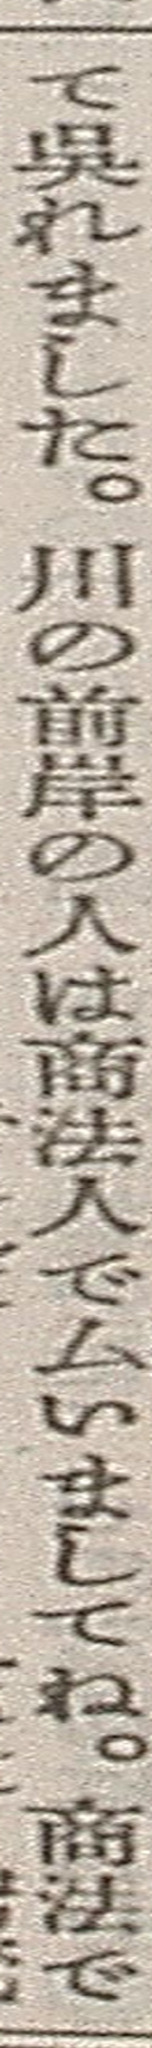て呉れました。川の前岸の人は商法人でムございましてね。商法で
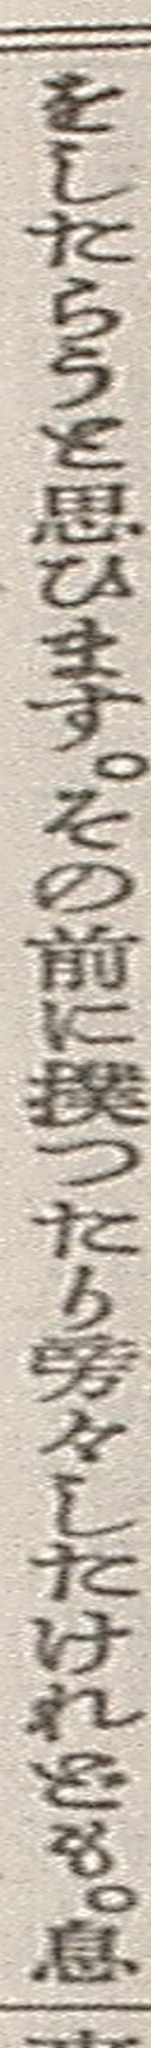をしたらうと思ひます。その前に撲つたり旁々したけれども。息
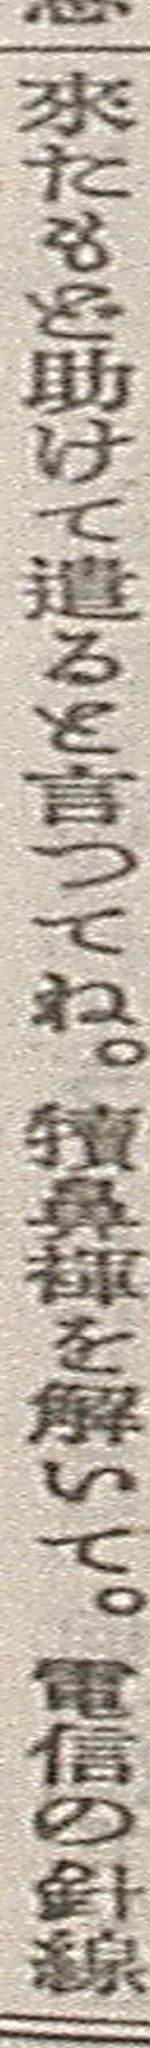来たもど助けて遣ると言つてね。犢鼻褌を解いて。電信の針線
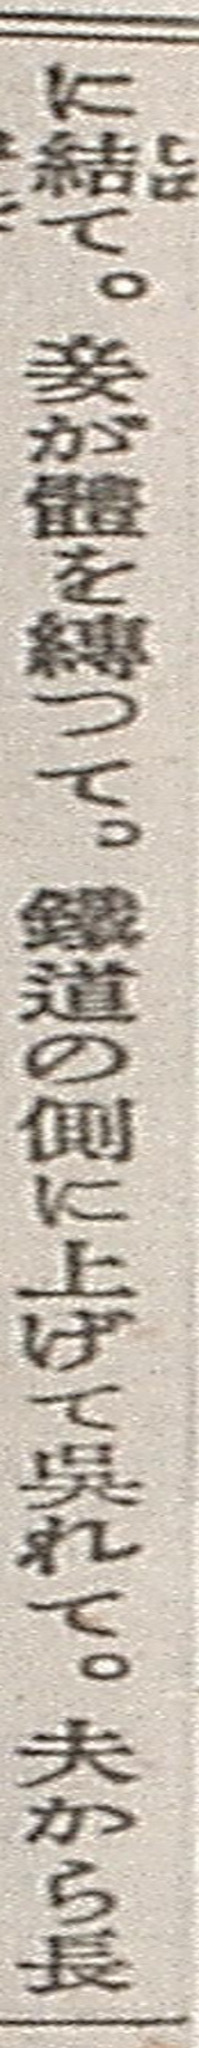に結て。妾が体を縛つて。鉄道の側に上げて呉れて。夫から長
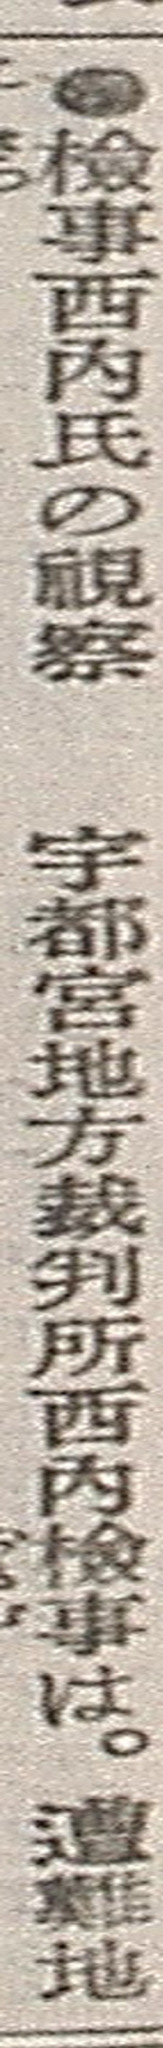●検事西内氏の視察宇都宮地方裁判所西内検事は。遭難地
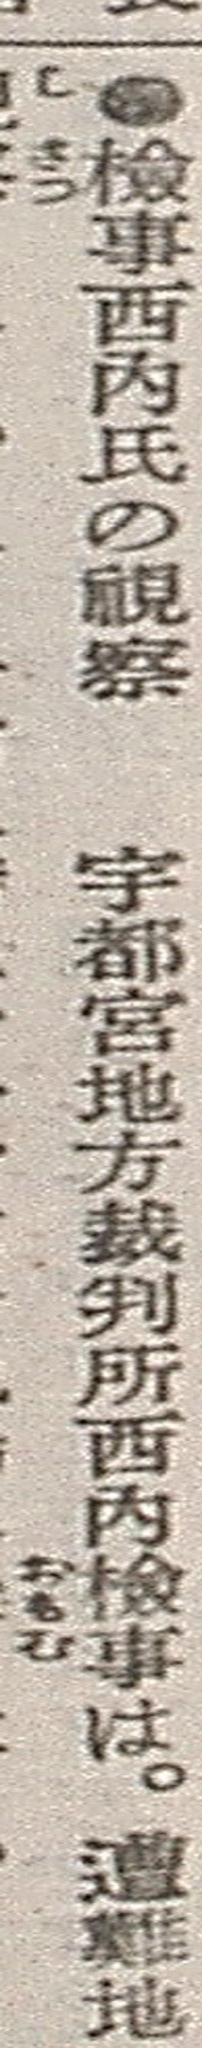●検事西内氏の視察宇都宮地方裁判所西内検事は。遭難地
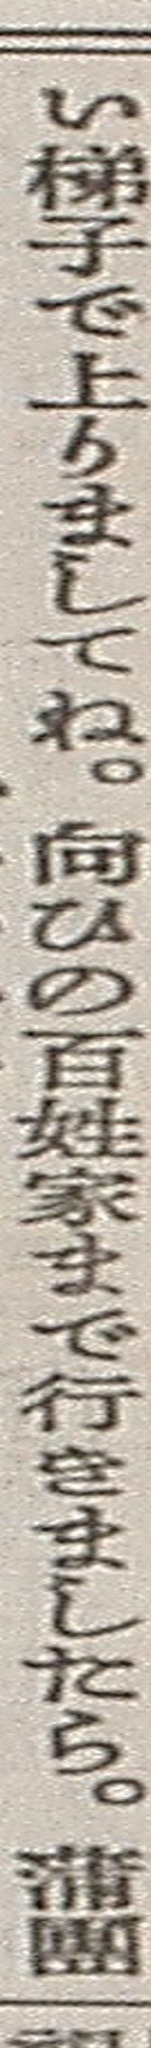い梯子で上りましてね。向ひの百姓家まで行きましたら。蒲団
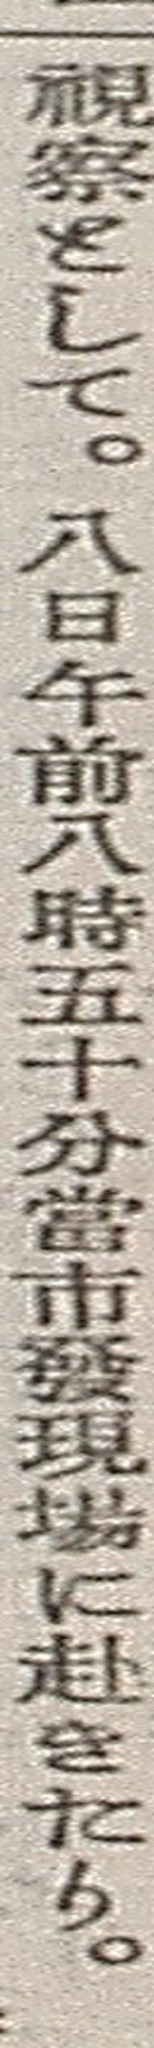視察として。八日午前八時五十分当市発現場に赴きたり。
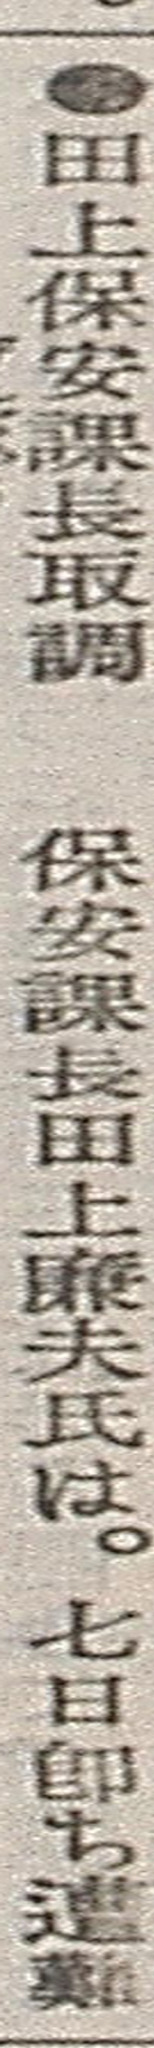●田上保安課長取調保安課長田上廉夫氏は。七日即ち遭難
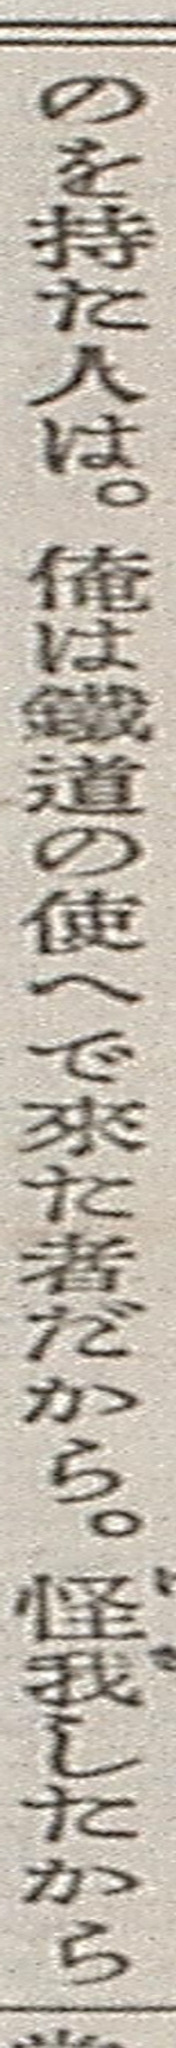のを持た人は。俺は鉄道の使へで来た者だから。怪我したから
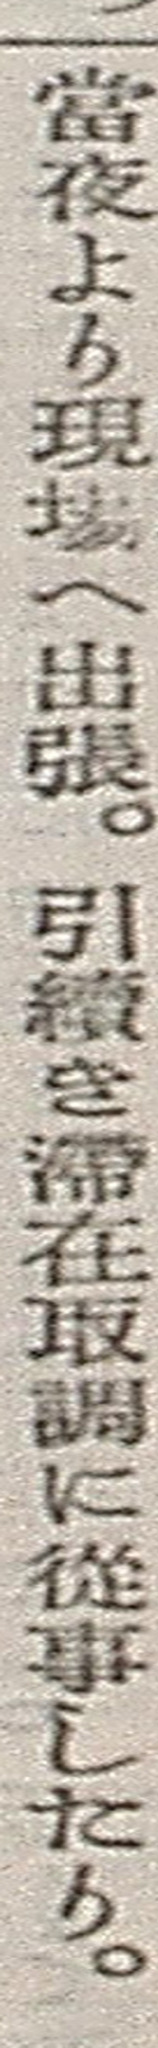当夜より現場へ出張。引続き滞在取調に従事したり。
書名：風俗畫報臨時増刊第百九十九號　明治三十二年十月各地災害圖會（前編之續）
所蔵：東京大学地震研究所図書室 Earthquake Research Institute Library, The University of Tokyo, JAPAN
